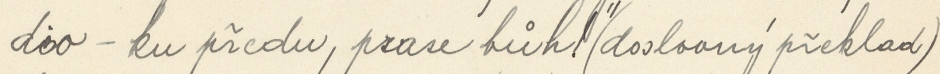dio - ku předu, prase bůh!“ (doslovný překlad)
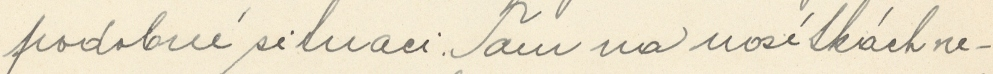podobné situaci. Tam na nosítkách ne-
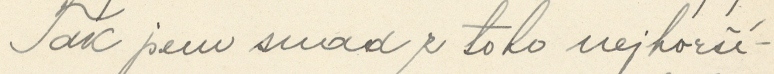Tak jsem snad z toho nejhorší-
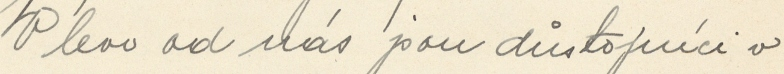V levo od nás jsou důstojníci v
